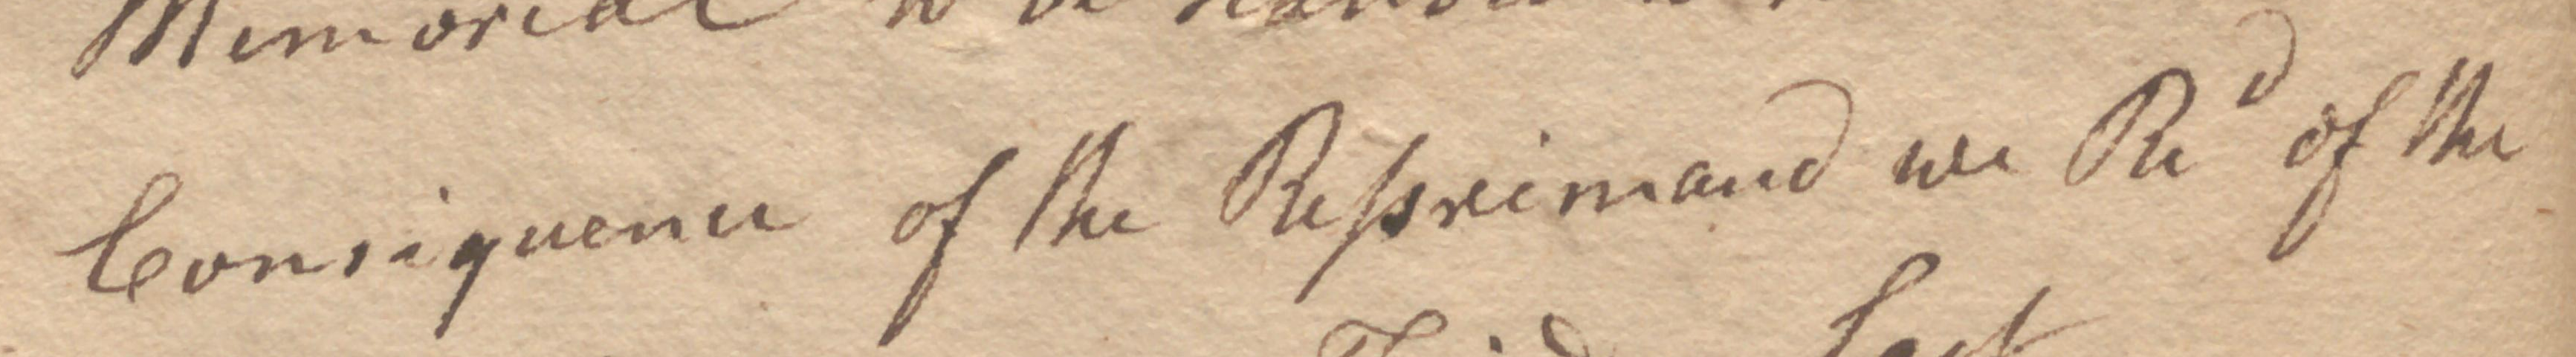Consiquence of the Reprimand we Re^d. of the
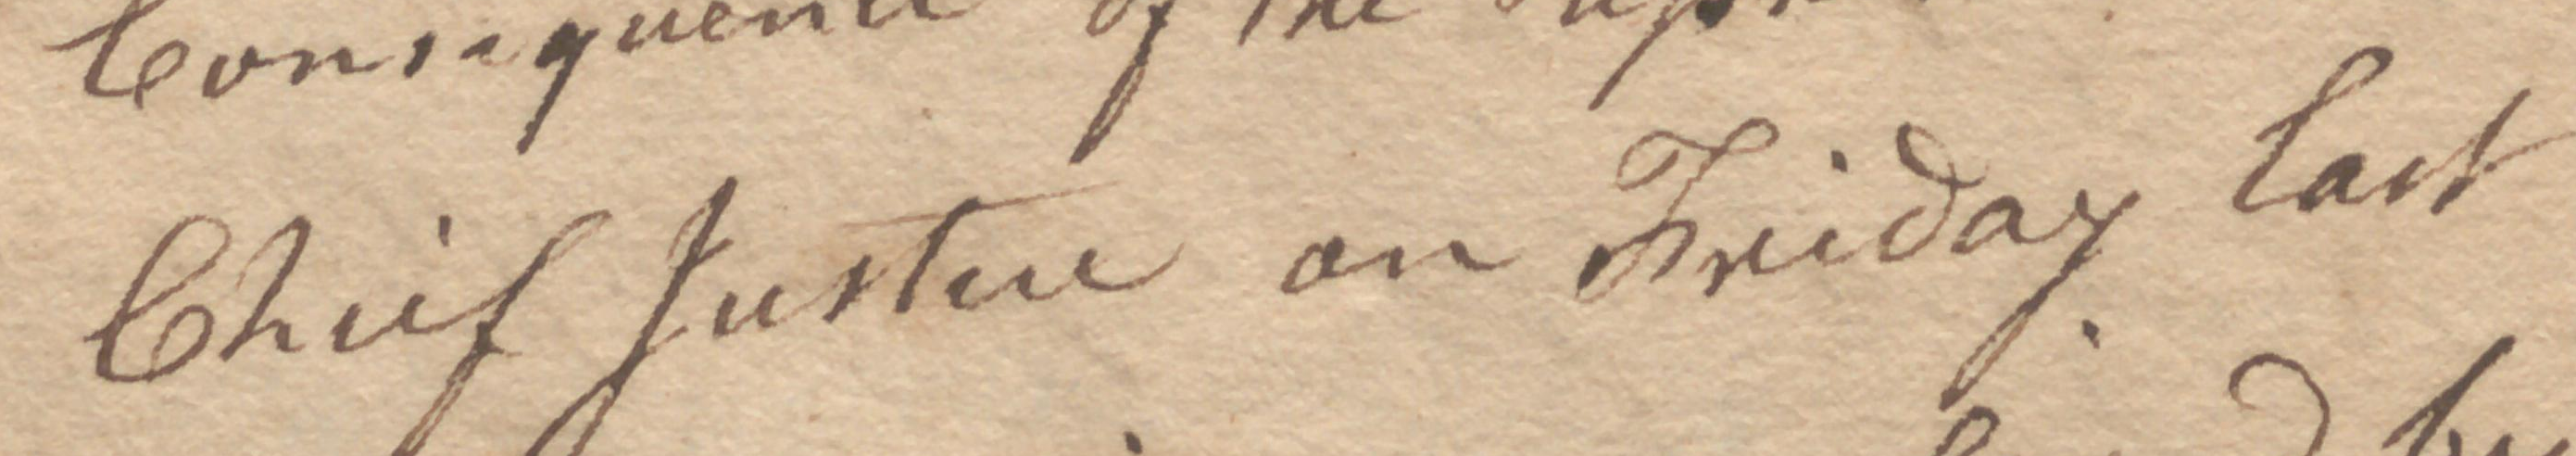Chief Justire on Friday last
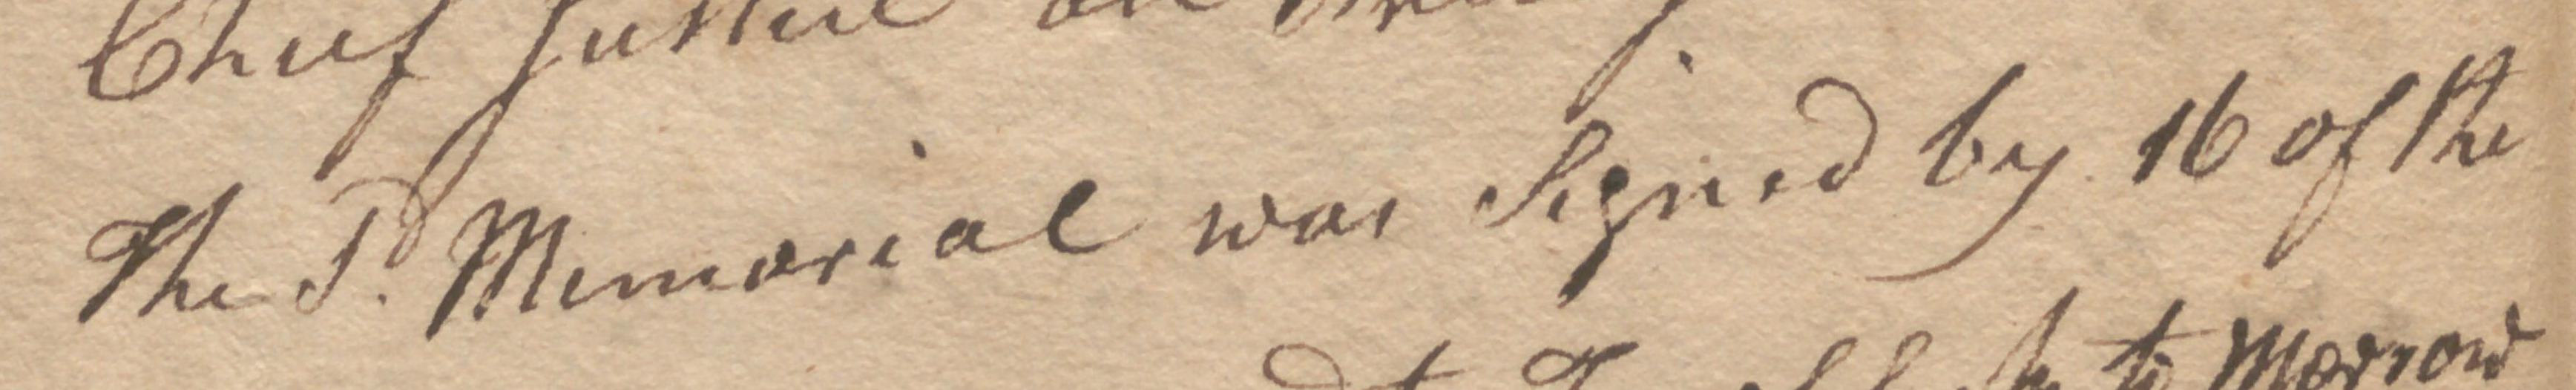The s^d. Memorial was signed by 16 of the
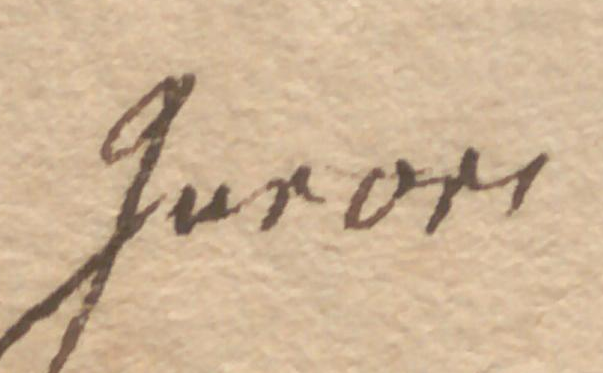Jurors
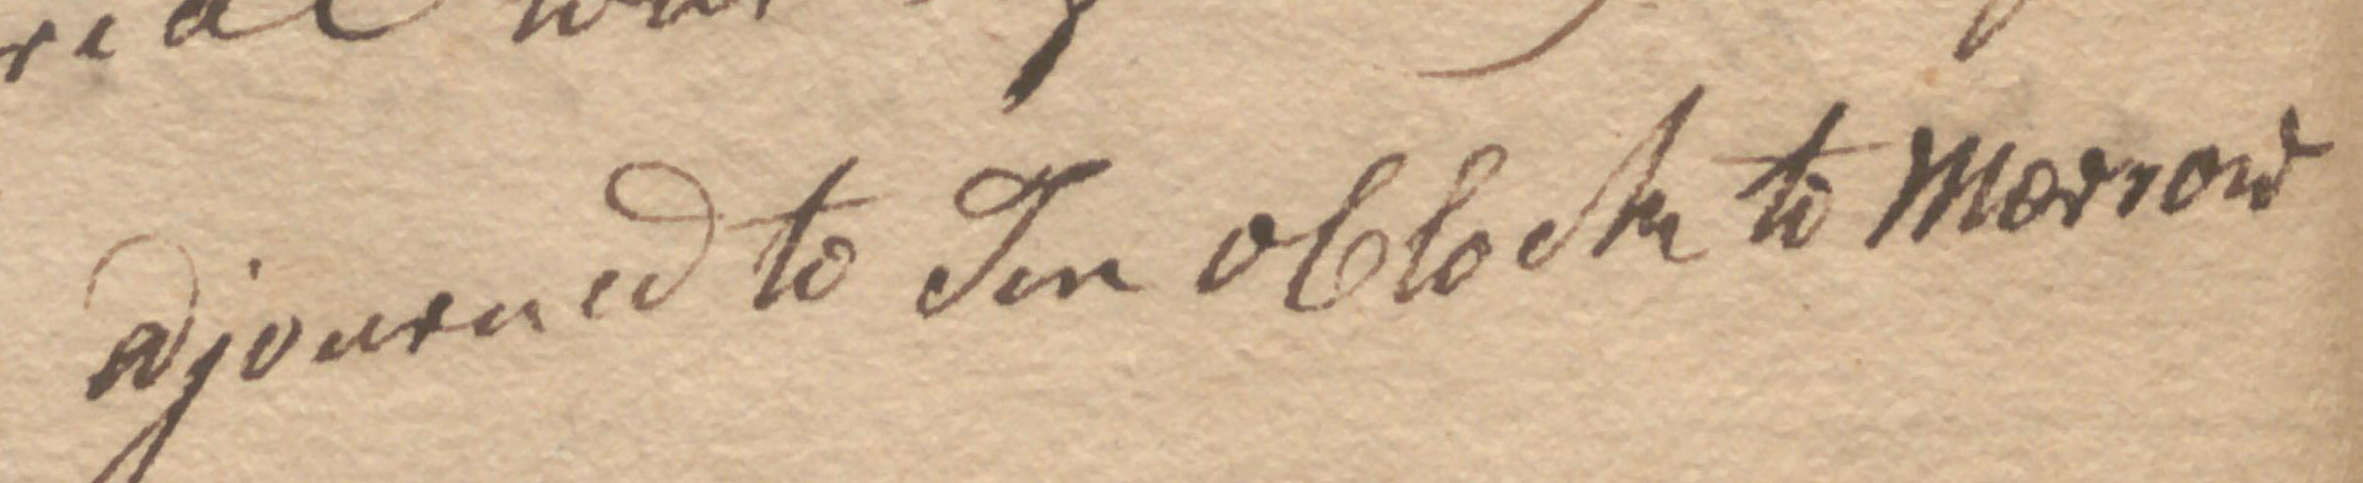ajournned to Ten oClock to Morrow
